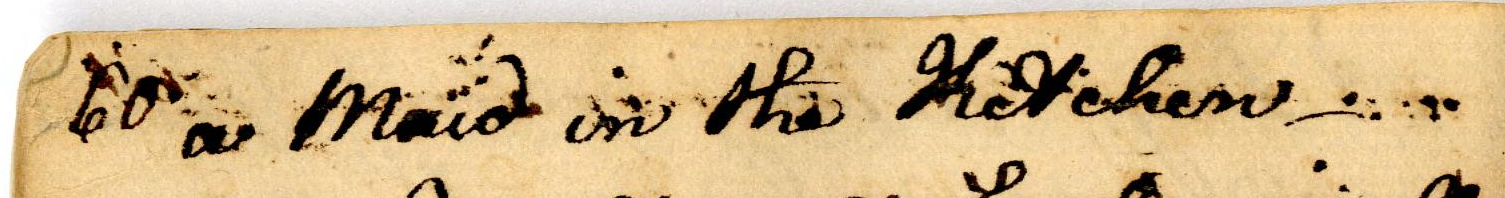a Maid in the Kitchen-
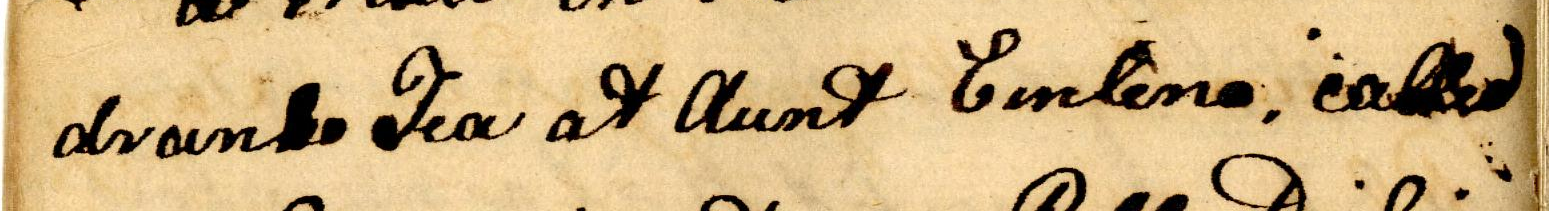drank Tea at Aunt Emlen, called
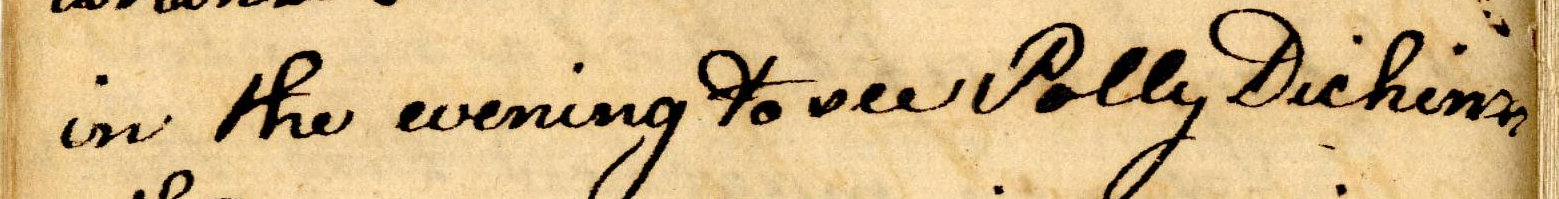in the evening to see Polly Dickinon
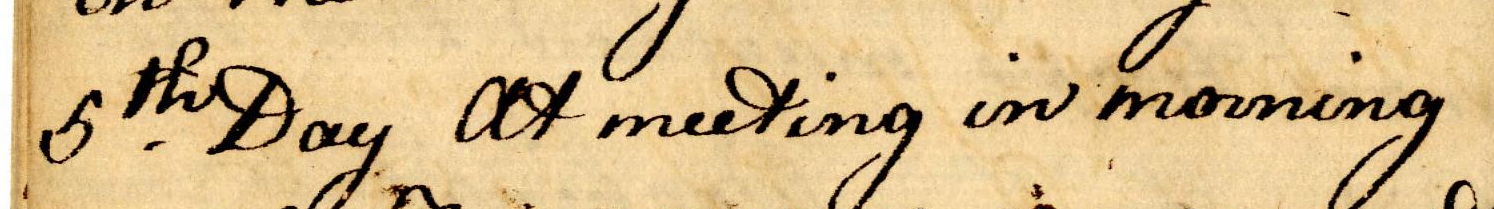5^th. Day At meeting in morning
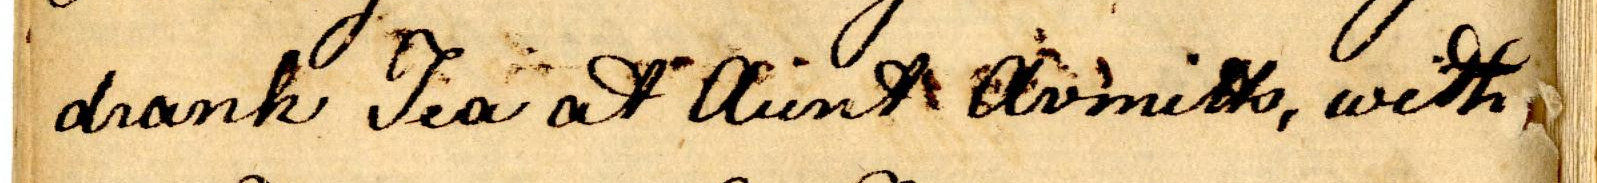drank Tea at Aunt Armitts, with
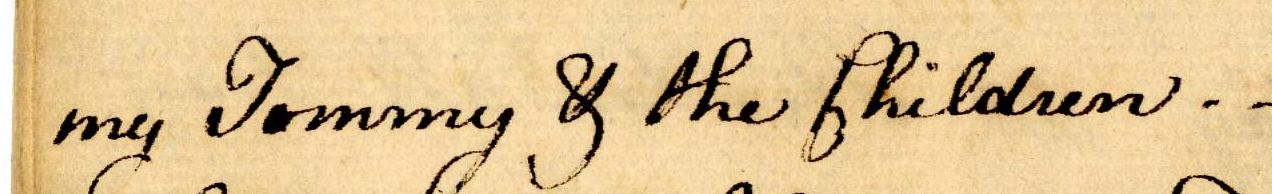my Tommy & the Children-
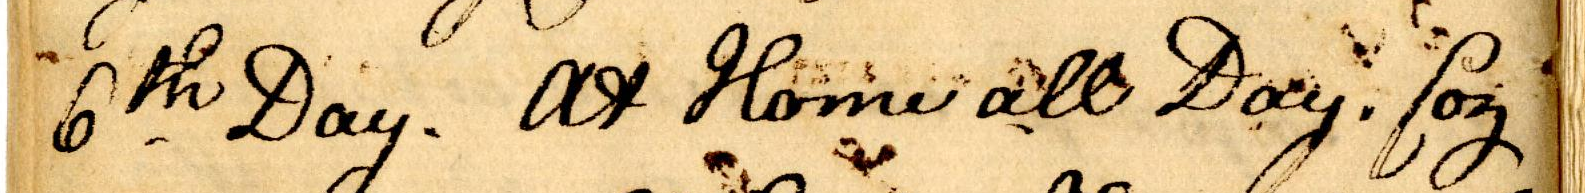6^th Day. At Home all Day. Coz
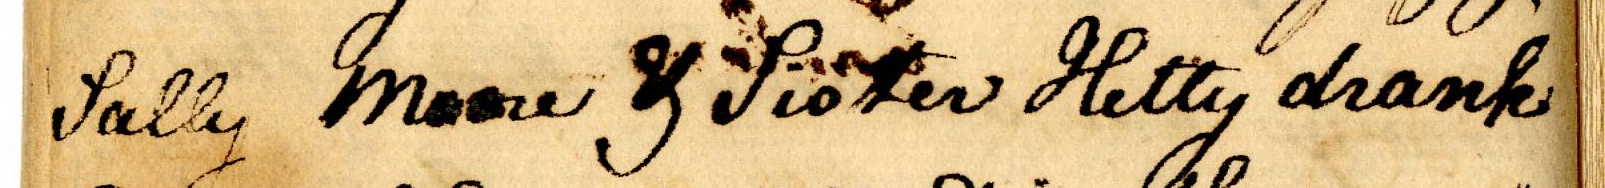Sally Moore & Sister Hetty drank
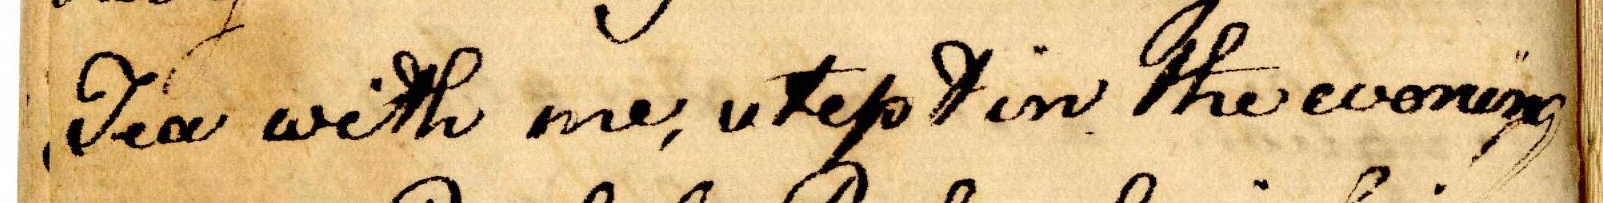Tea with me, stept in the evening
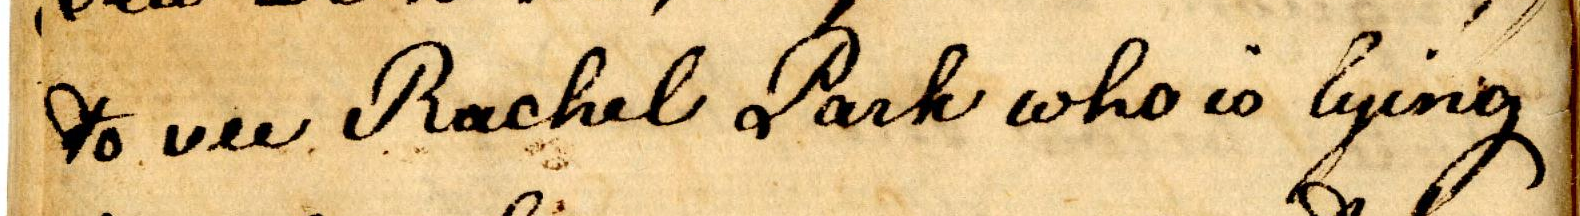to see Rachel Park who is lying
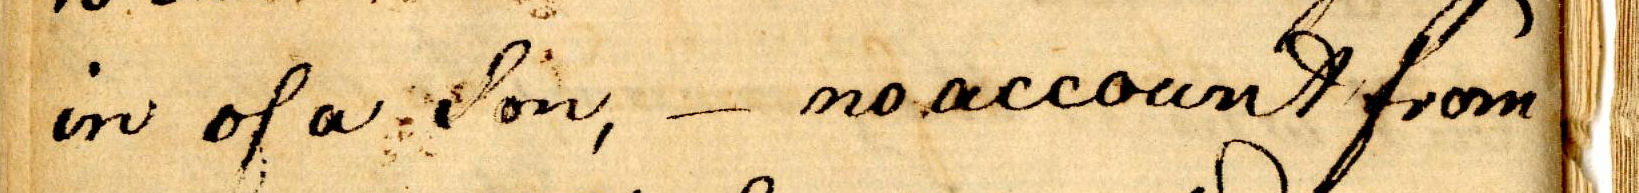in of a Son,- no account from
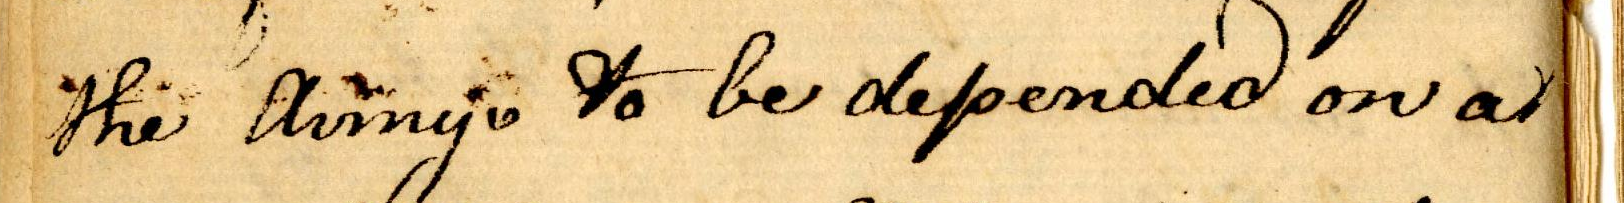the Armys to be depended on at
